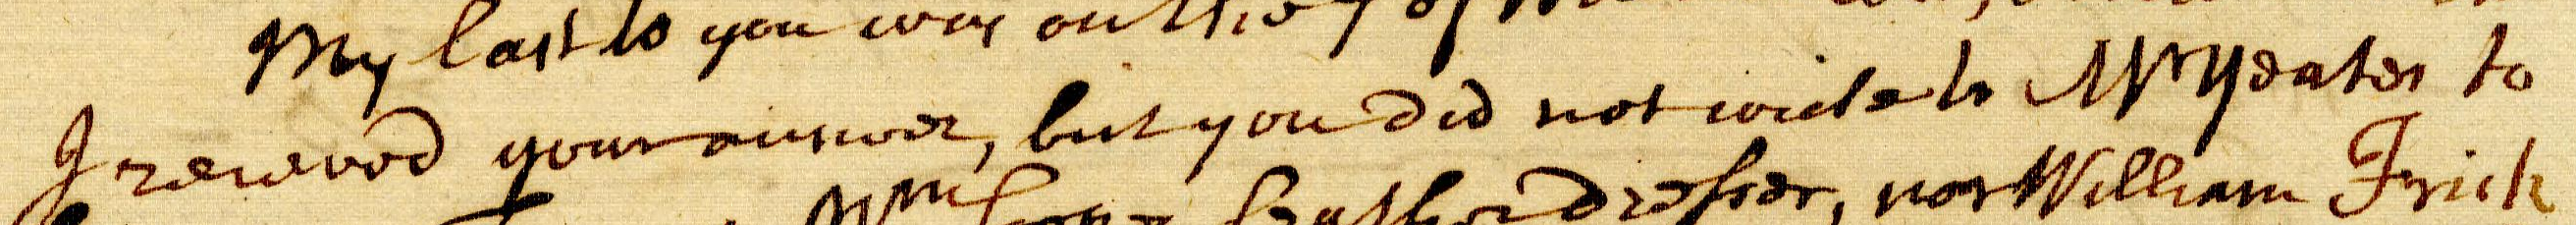I received your answer, but you did not write to M^r Yeates to
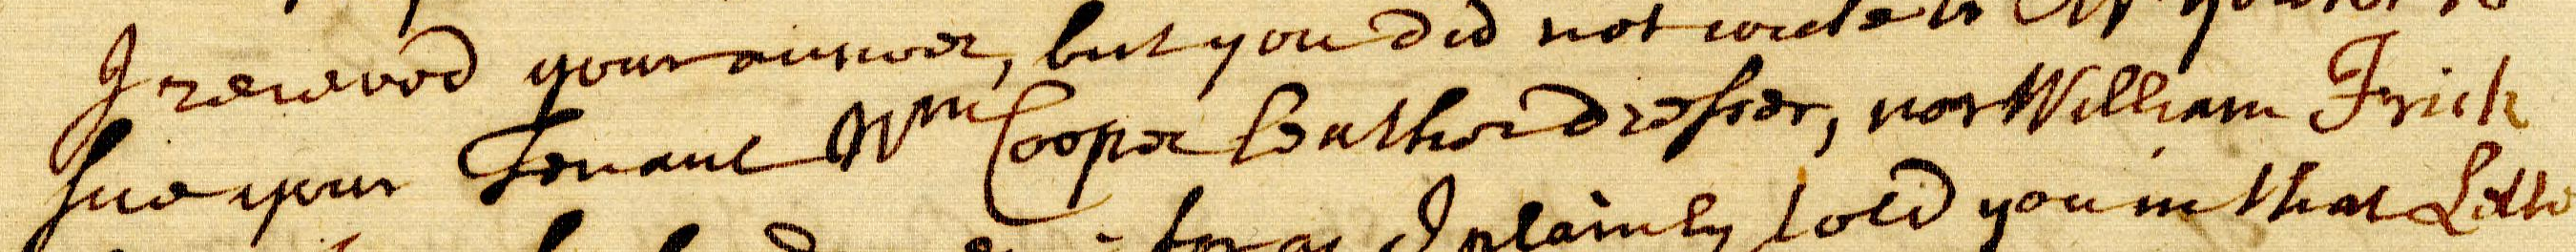Sue your Tenant M^r Cooper leather dresser, nor William Frick
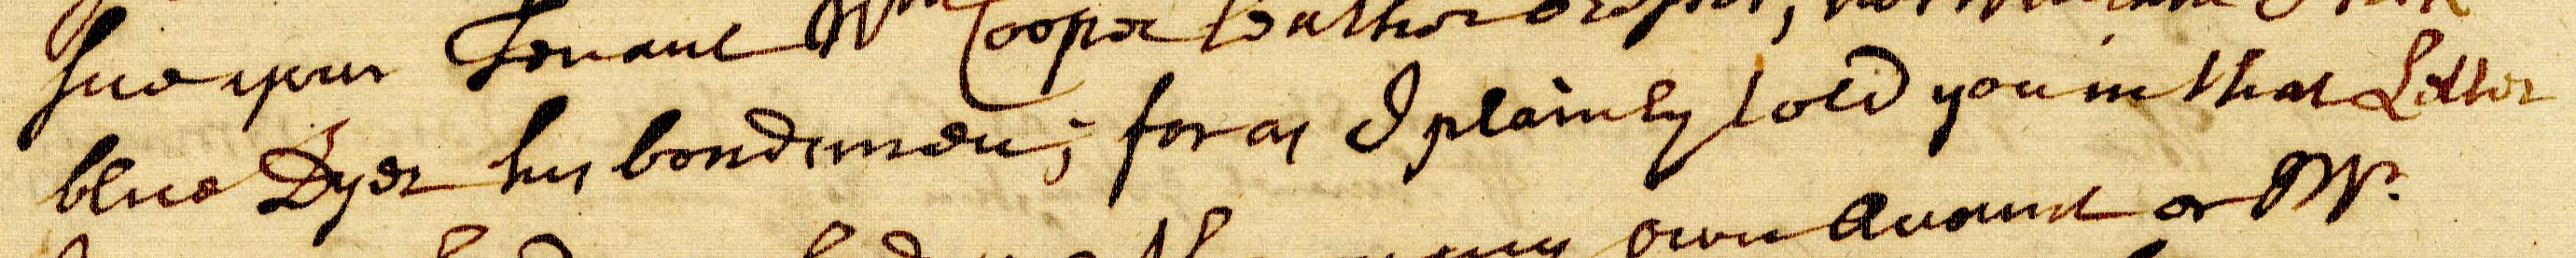blue Dyer his bondsmen; for as I plainly told you in that Letter
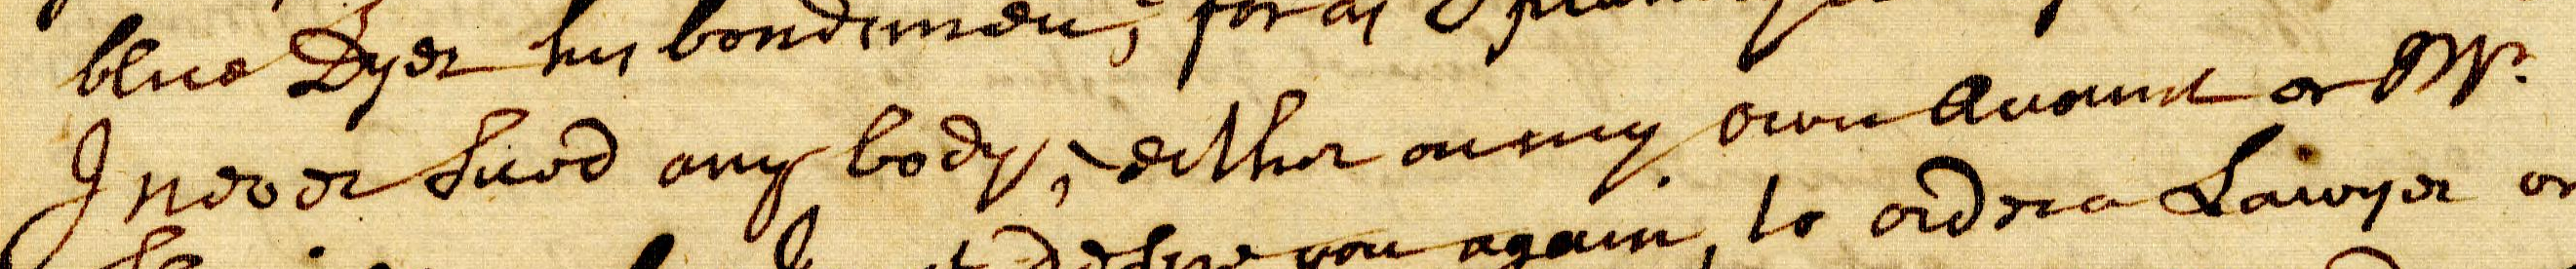I never Sued any body; either on my own Account or M^r.
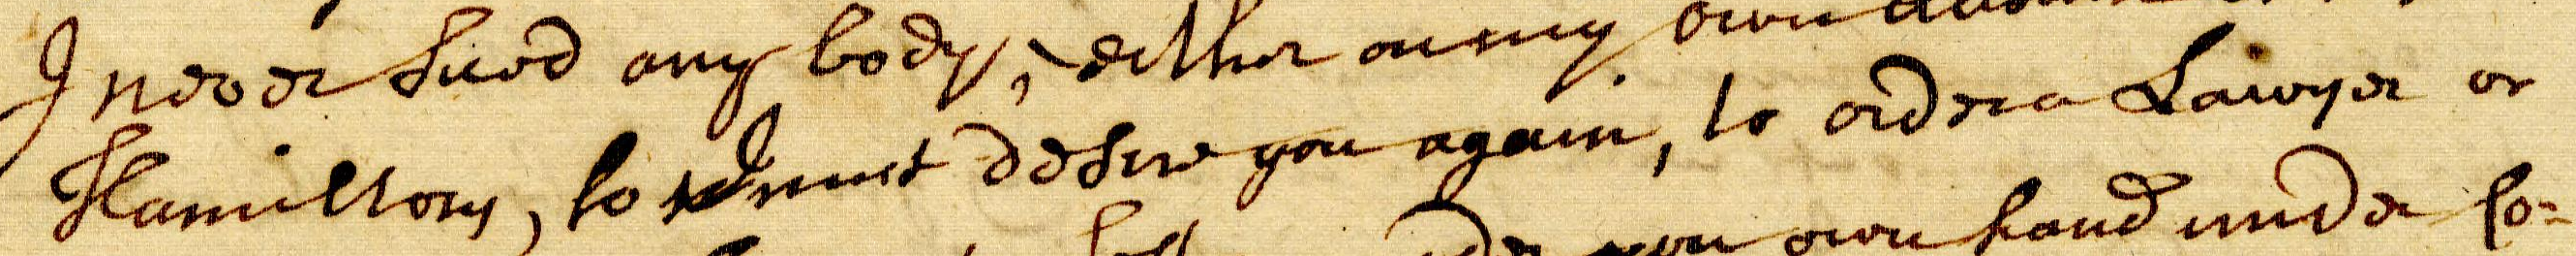Hamiltons, so I must desire you again, to order a Lawyer or
